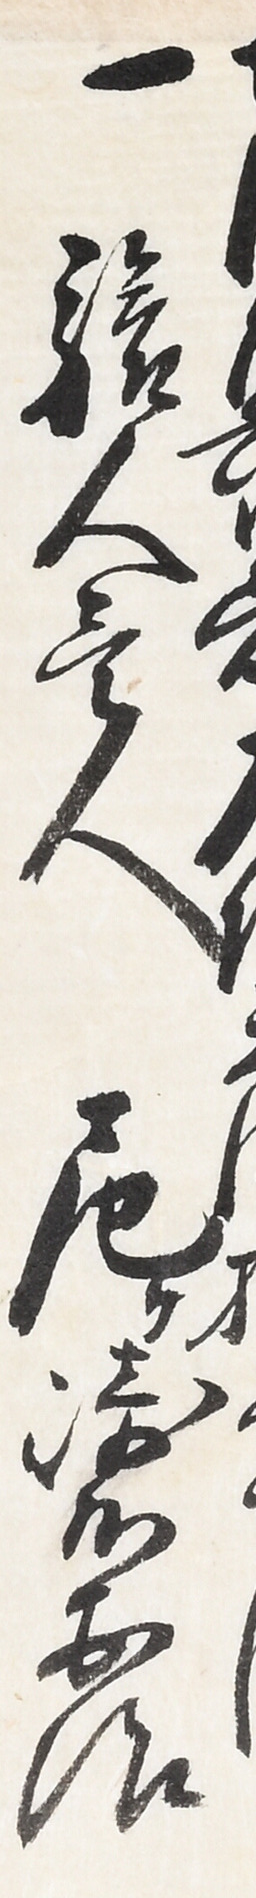一旅人壱人尼ヶ崎や安治
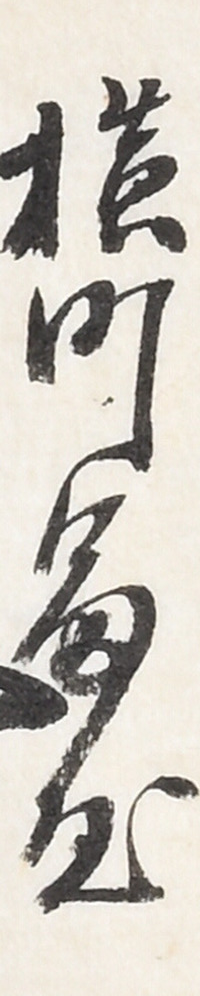横町冨屋
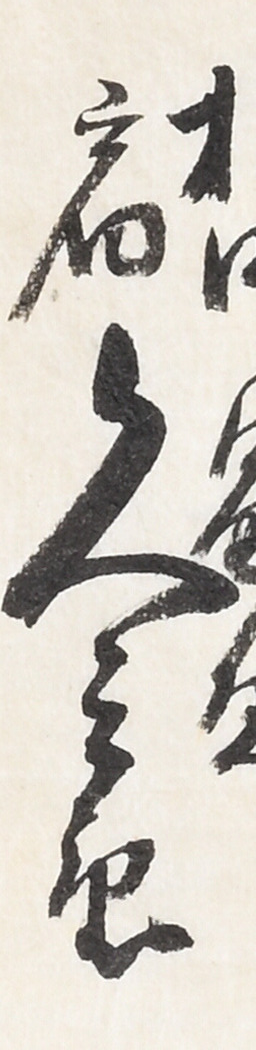宿久兵衛
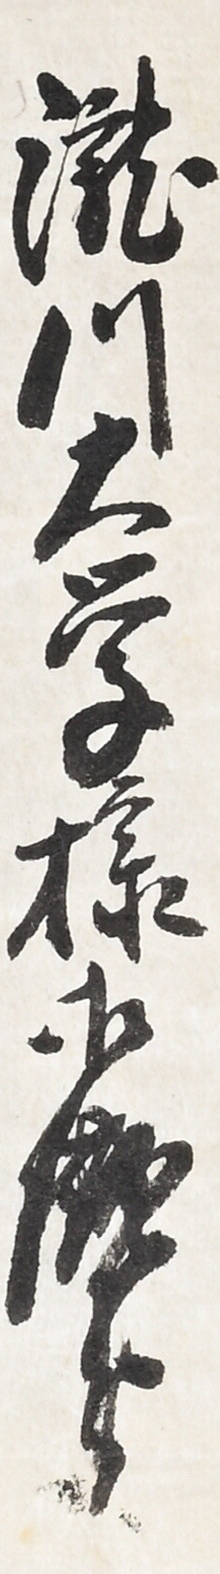瀧川大学様御領分
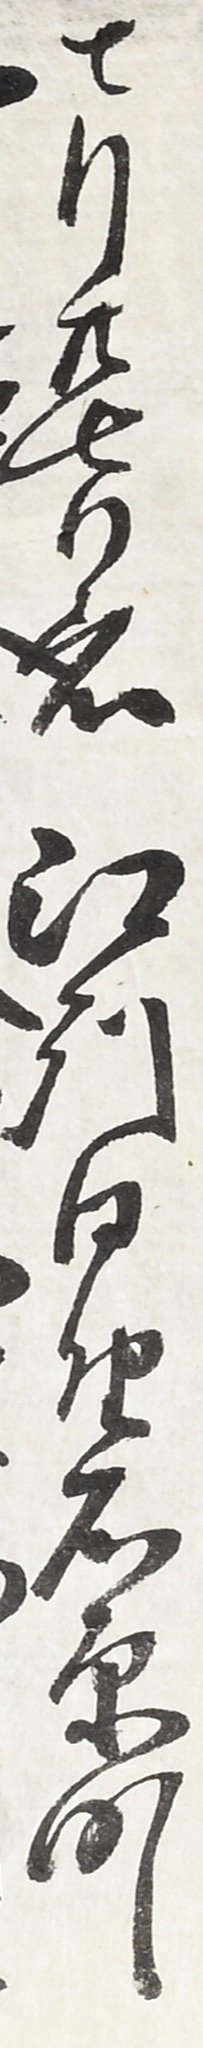七月廿七日着江州日野石原町
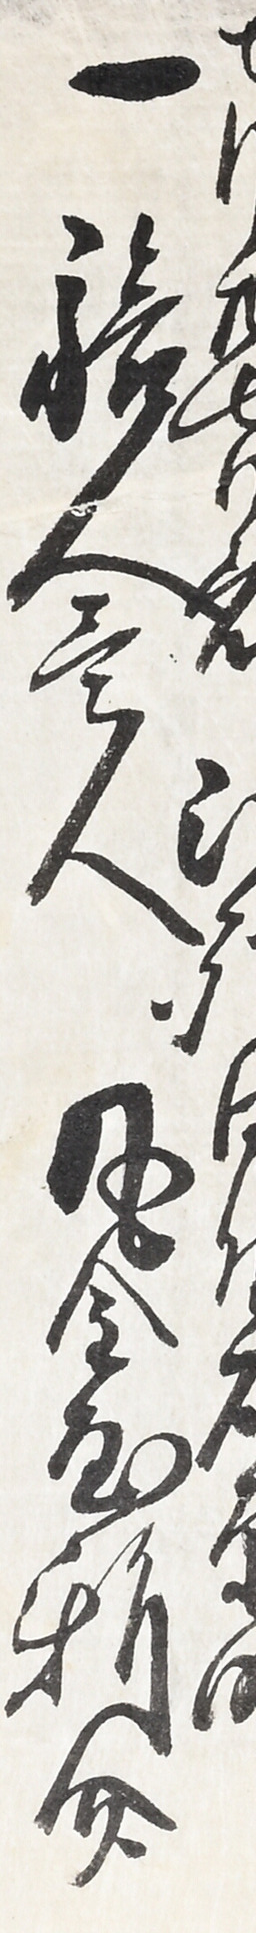一旅人壱人丸金屋新介
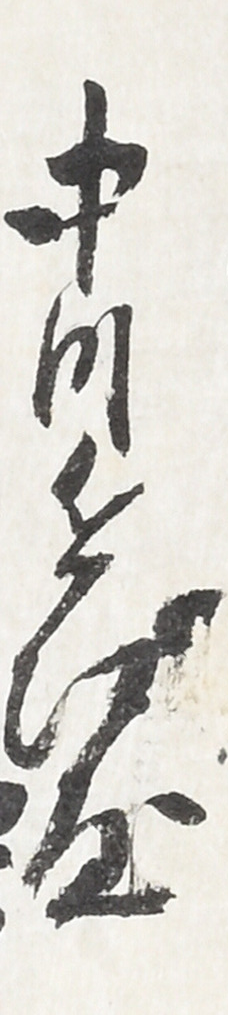中町近江屋
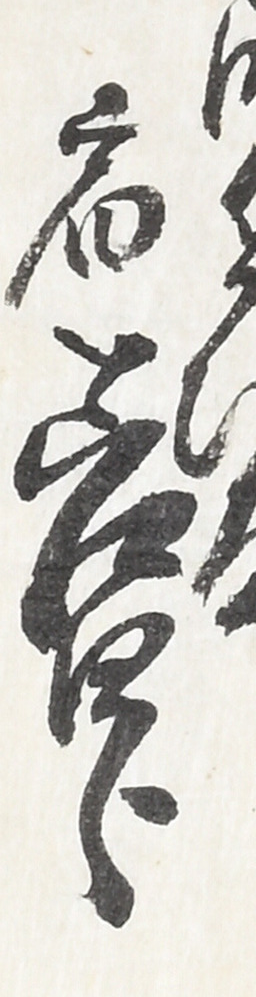宿善四郎
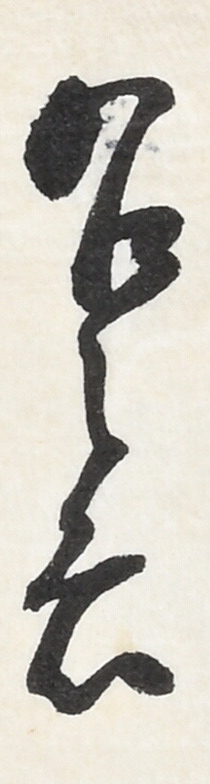右之者

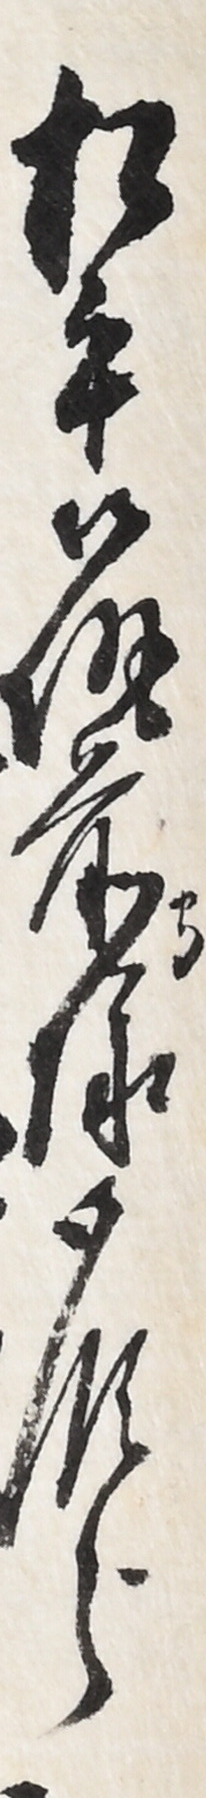松平美濃守様御領分
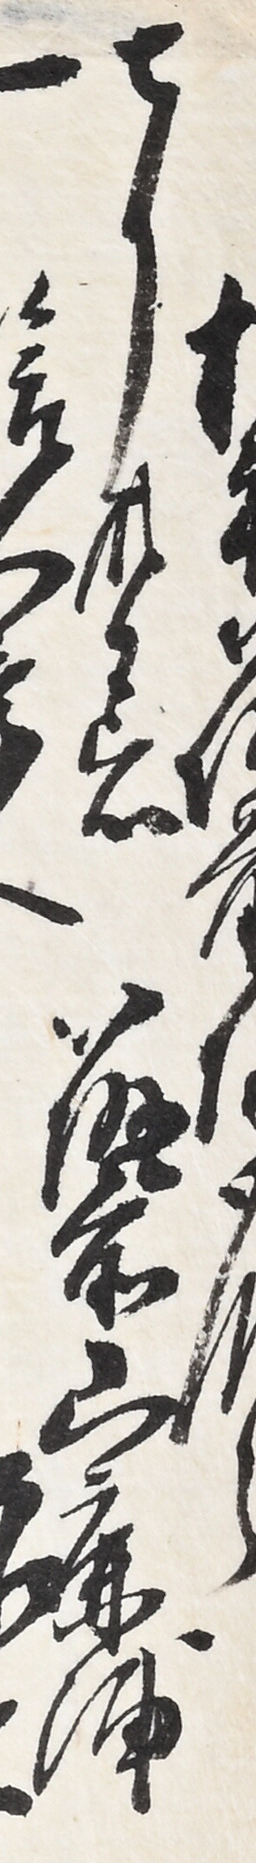七月卅着筑前山鹿浦
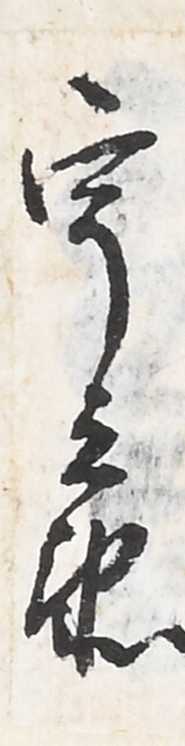宇兵衛
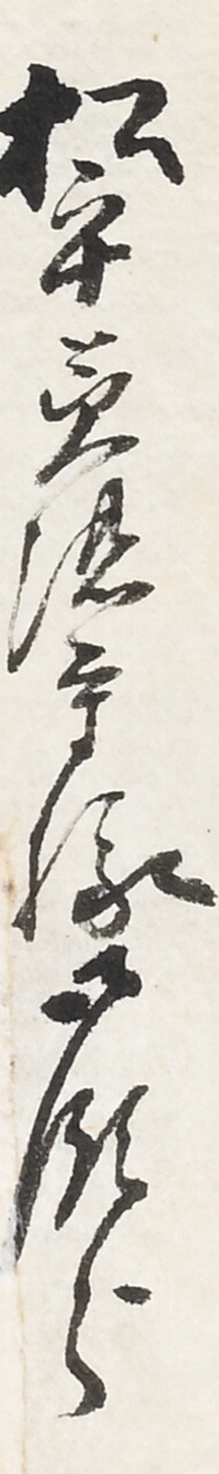松平美濃守様御領分
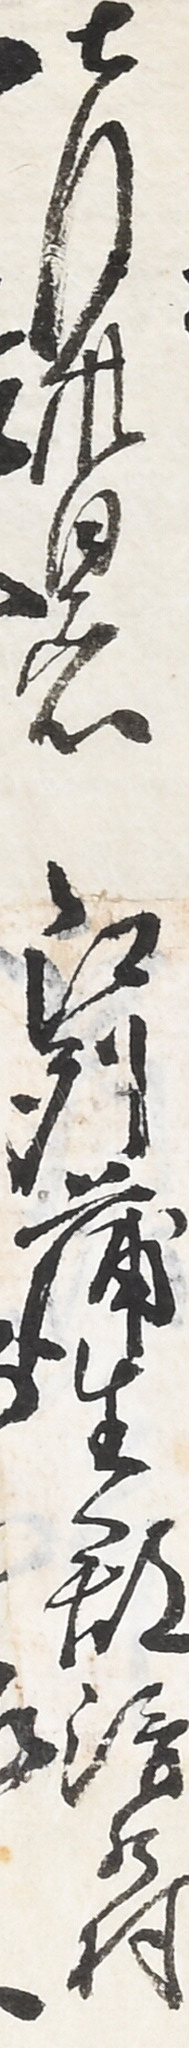七月卅日着江州蒲生郡清水村
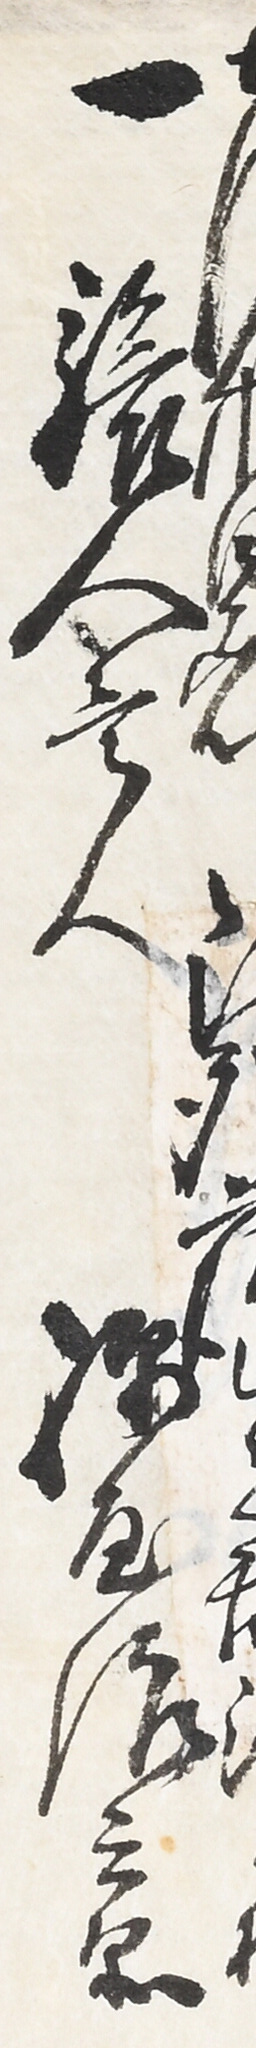一旅人壱人綿屋治兵衛
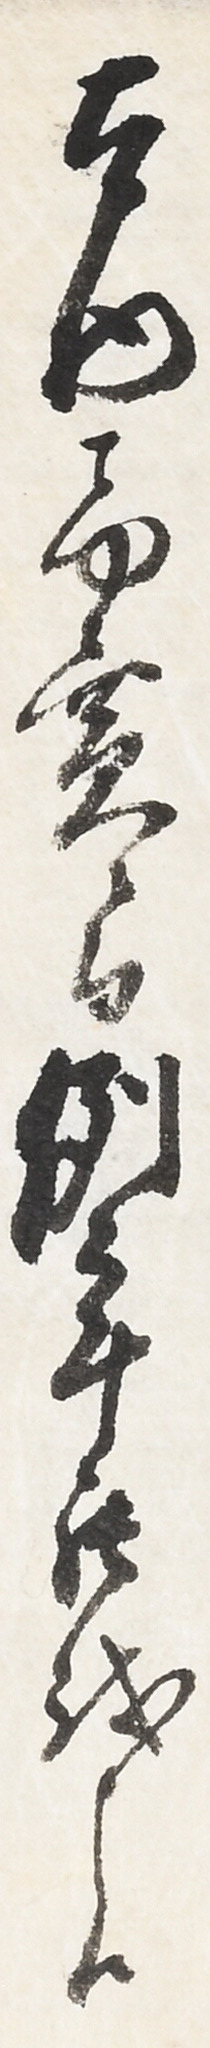太物商売ニ而例年罷越申候
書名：旅人泊控帳
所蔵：伊那市立高遠町図書館・合同会社AMANE
